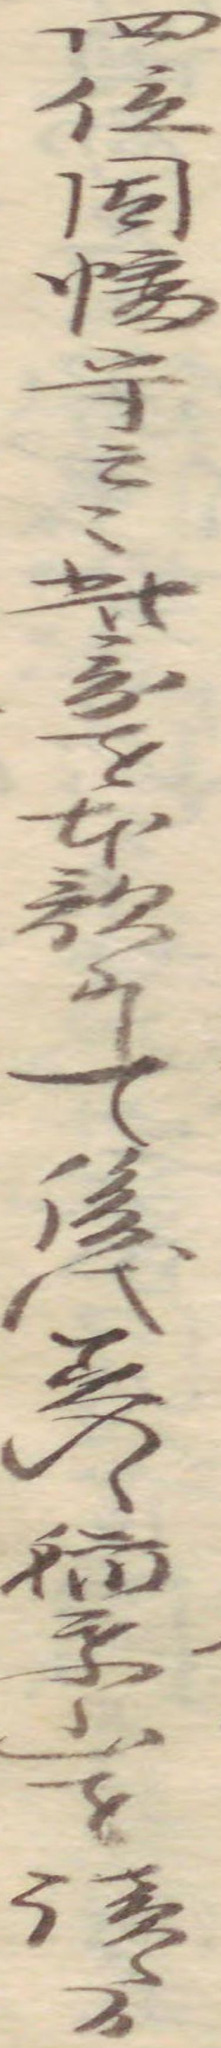四位因幡守云〻此歌を本歌にして後代美のゝ稲葉山を読たる
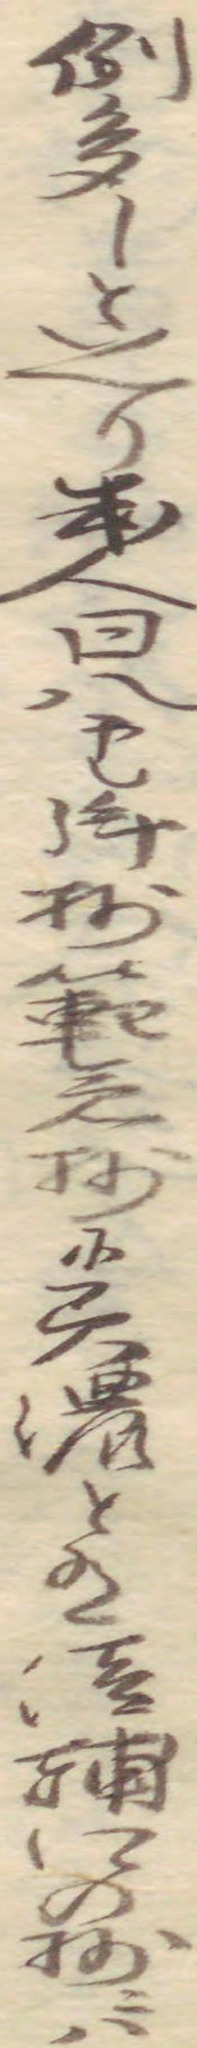例多しといへり或人曰八雲御抄範兼抄に美濃と有清輔卿の抄ニは
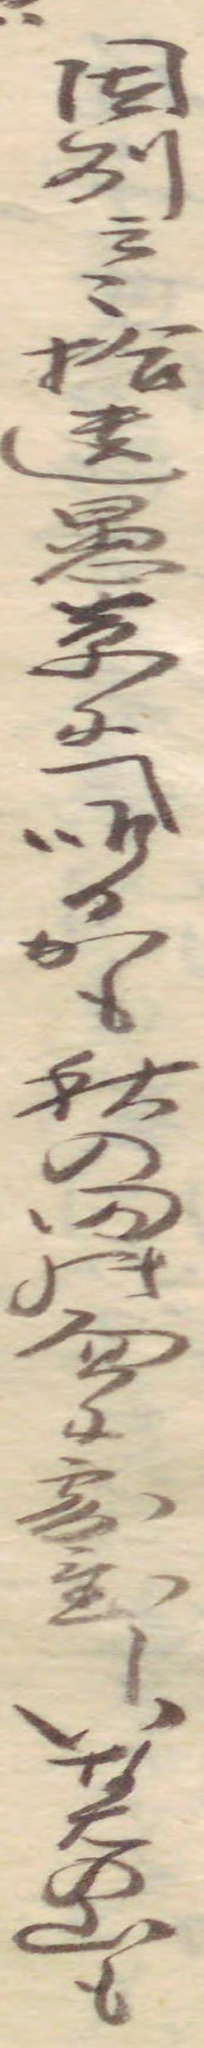因州云〻拾遺愚草に〽昨日かも秋の田の面に露置しいなはの山も
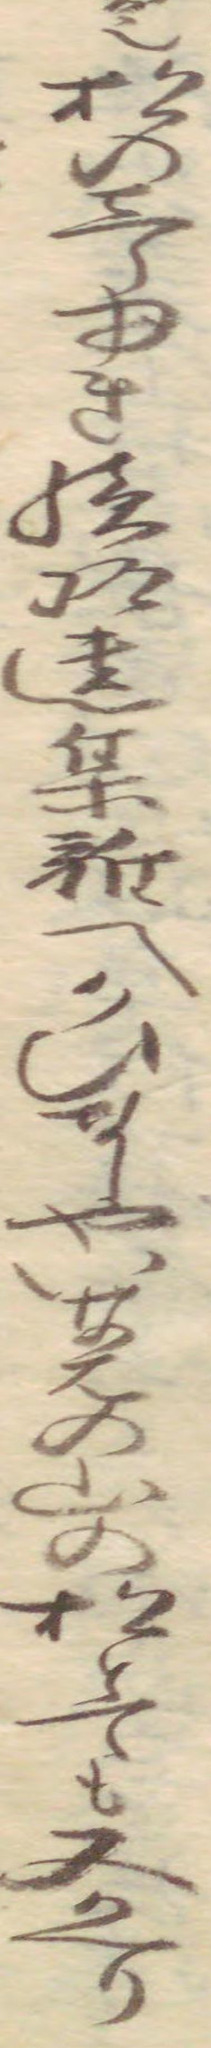松のしらゆき続拾遺集雑〽かひなしやいなはの山の松とても又かへり
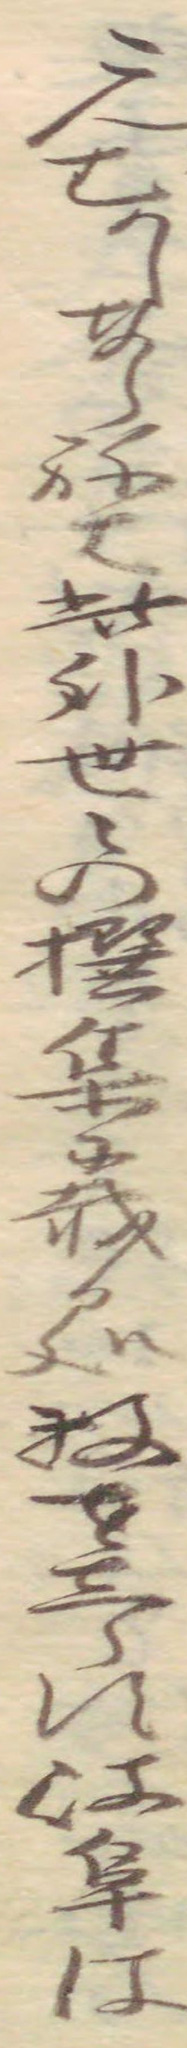こんむかしならねは此外世〻の撰集に載る処数をしらす岐阜は

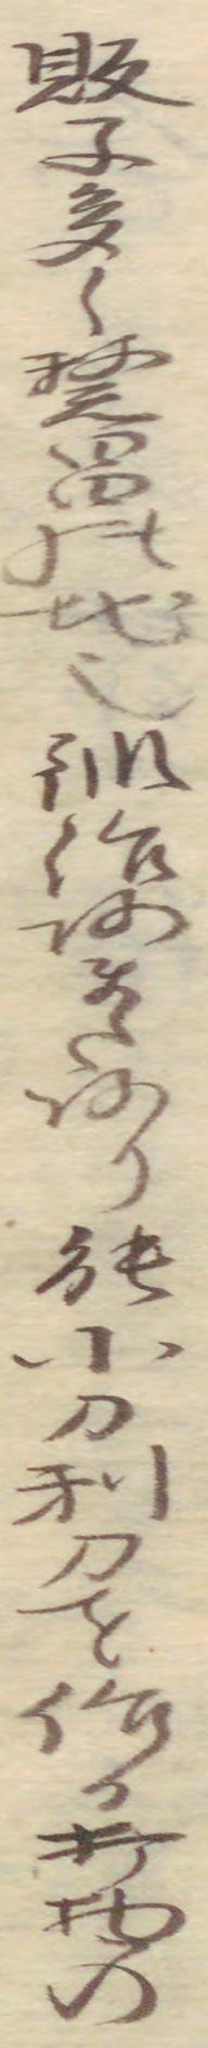敗子多く繁昌の地也鍛冶あまたあり能小刀利刀を作る打物の
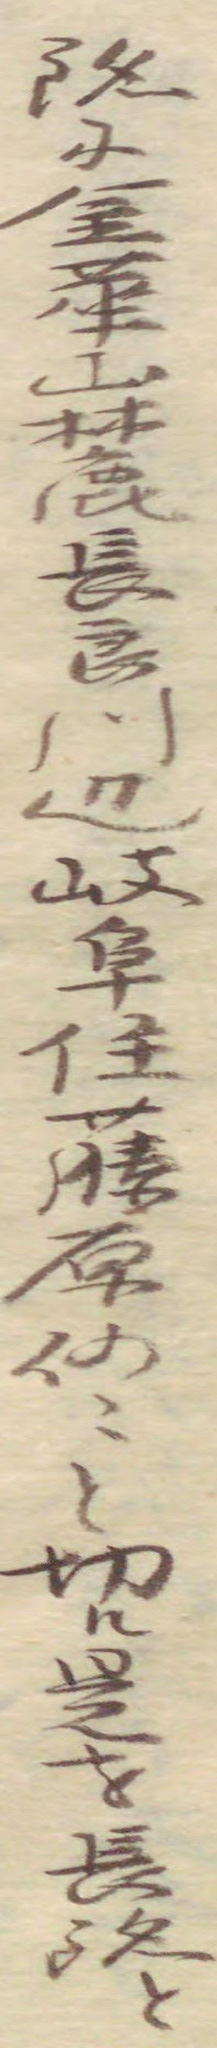銘に金華山麓長良川辺岐阜住藤原何〻と切ル是を長銘と
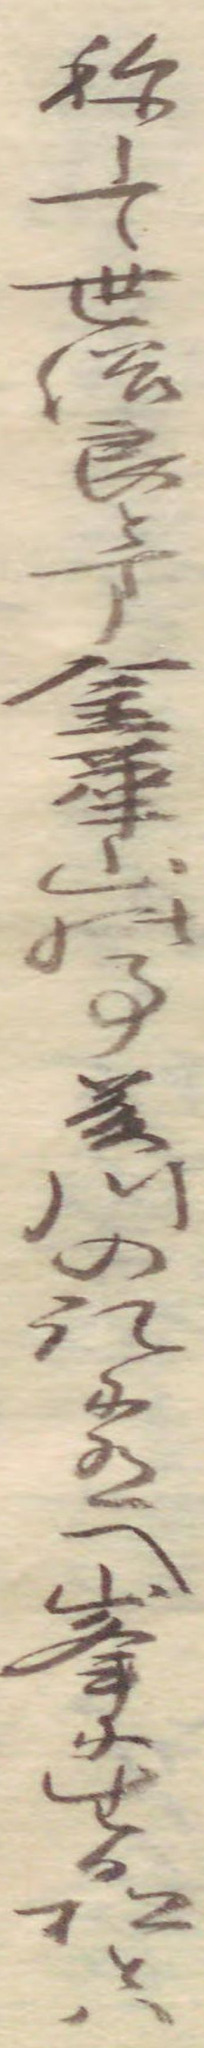称して世俗良とす金華山の事藤川の記に有〽峰に生る松とは
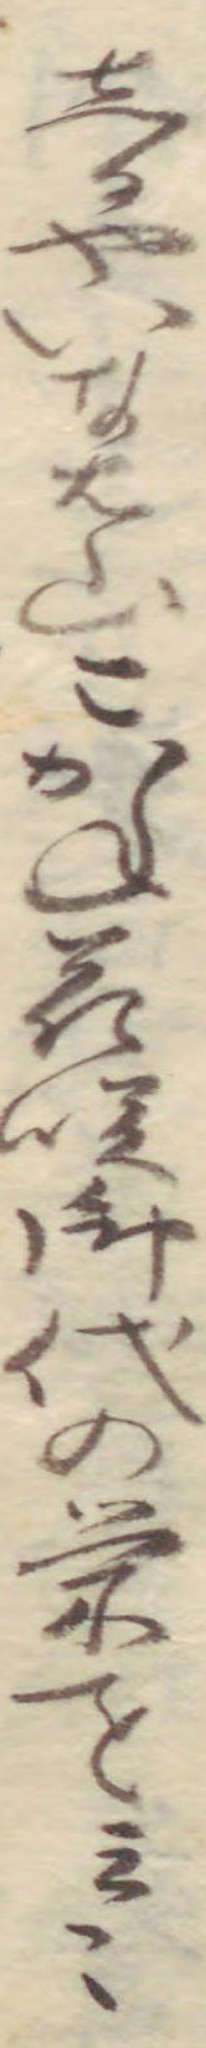しるやいなは山こかね花咲御代の栄を云〻
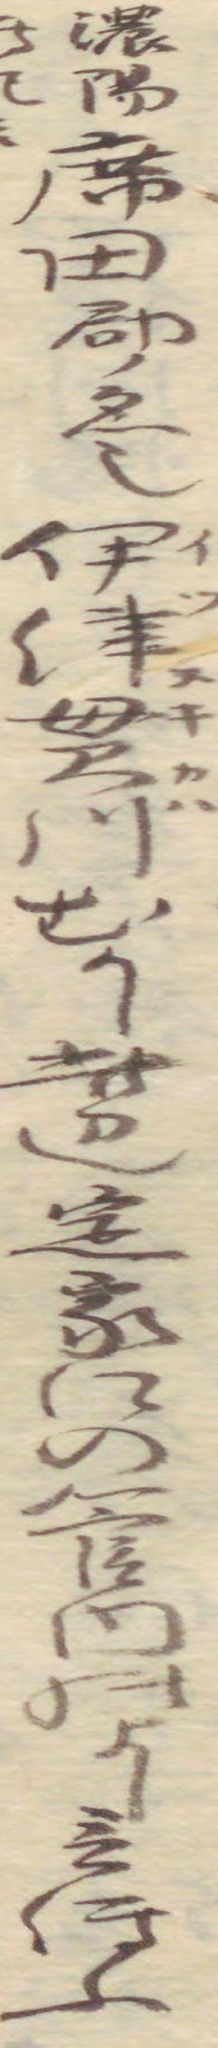席田郡ノ名也伊津貫川むかし此辺定家卿の管内のよし言伝ふ
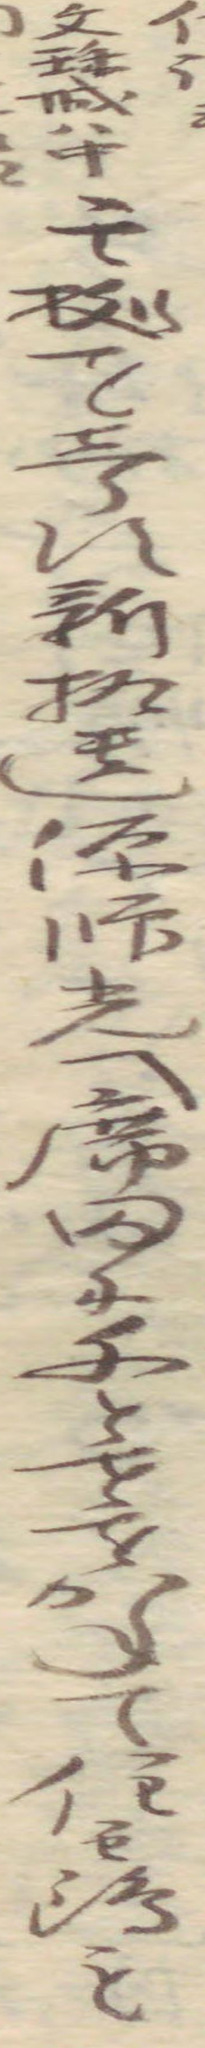其拠をしらす新拾遺源師光〽席田に千とせをかねて住鶴も
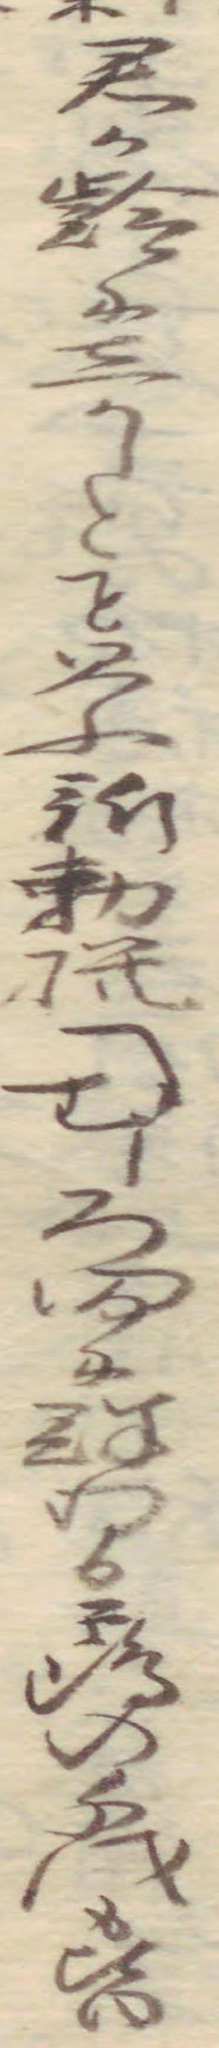君か齢にしかしとそ思ふ新勅撰〽むしろ田に群ゐる鶴の千代も皆
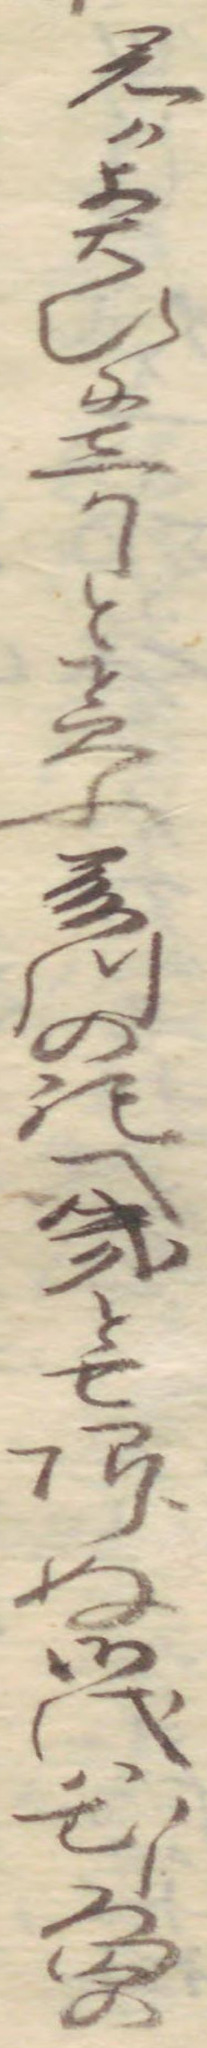君かよはひにしかしとそ思ふ藤川の記〽幾とせ限らぬ御代はむしろ田の
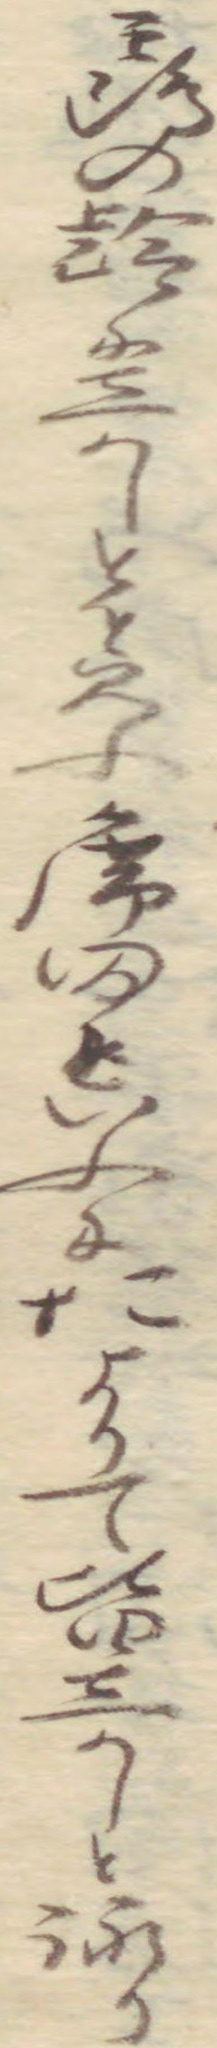鶴の齢にしかしとそ思ふ席田といふにたよりて皆しかしと詠り
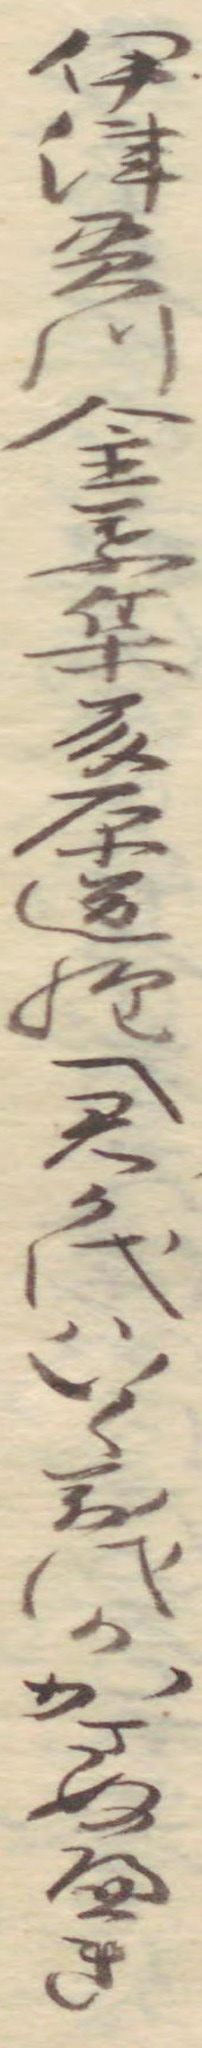伊津貫川金葉集藤原道経〽君か代はいく万代かかさぬへき
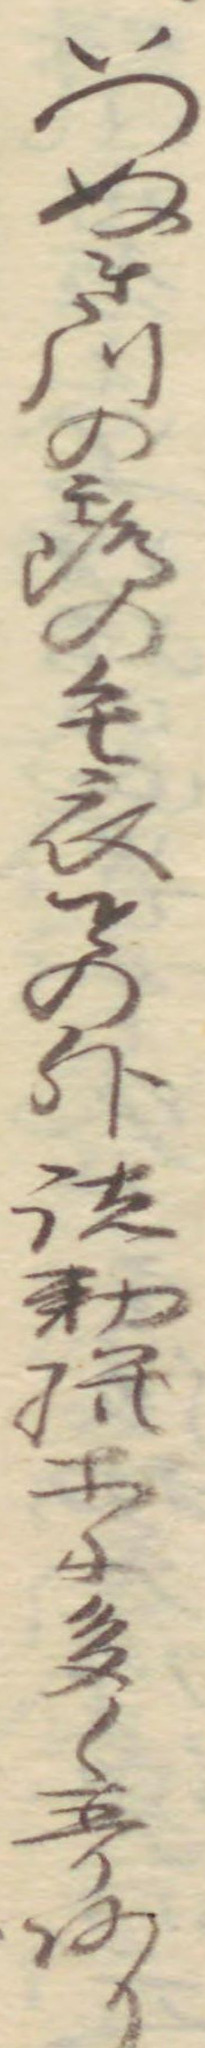いつぬき川の鶴の毛衣その外諸勅撰等に多く歌あり
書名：鶯宿雑記. 巻263-264
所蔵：国立国会図書館 National Diet Library, JAPAN
